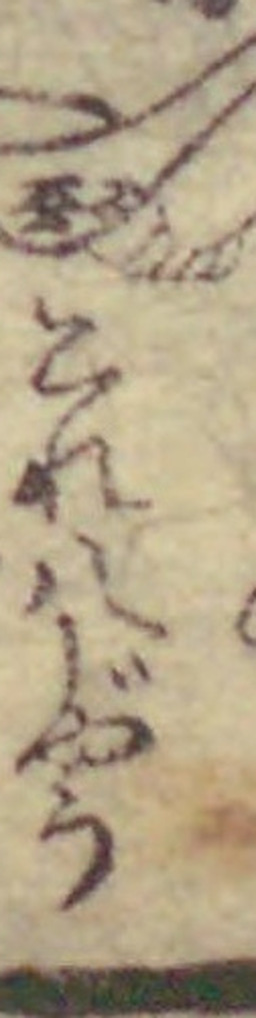これ八じやう
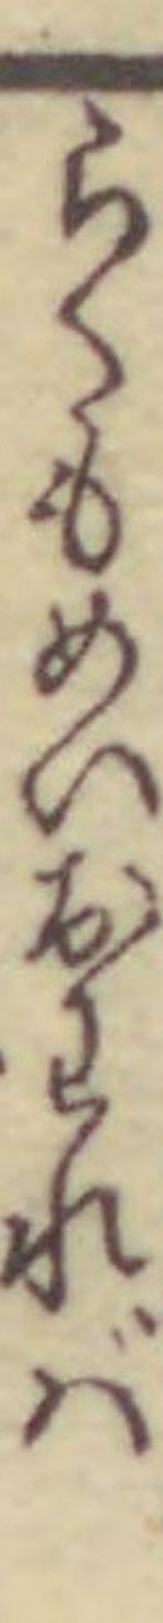らくもめいおわれば
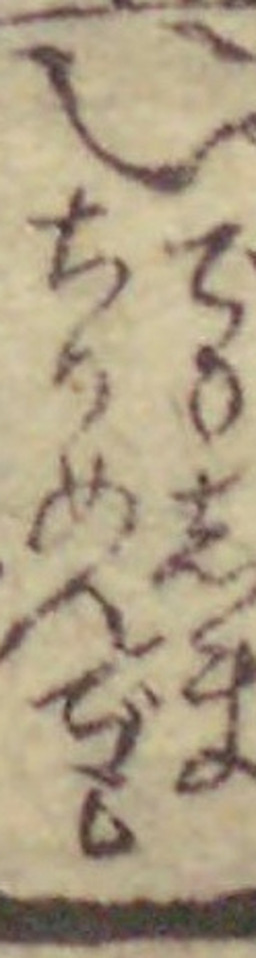ちりめんでも
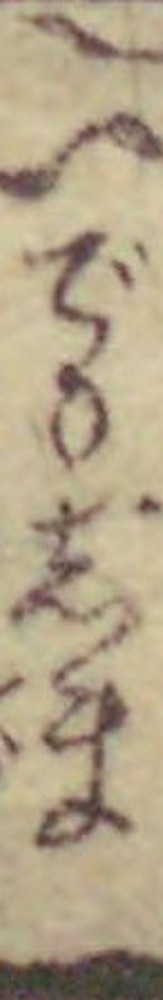でもしま
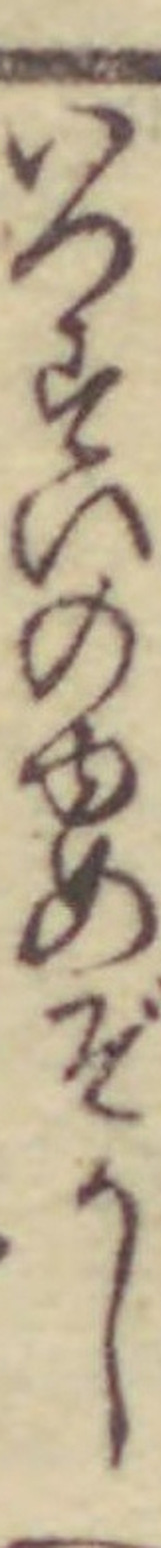いつすいのゆめぞかし
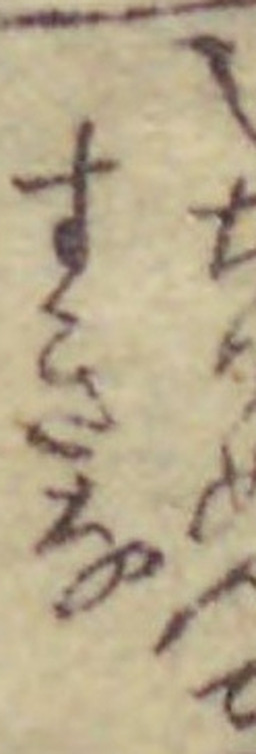すきな
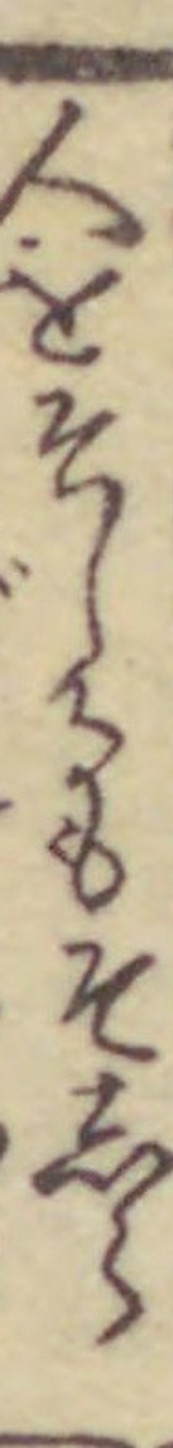人をそしるもそしら
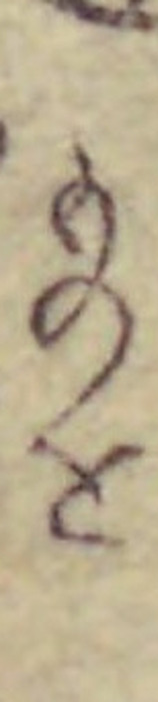ものを
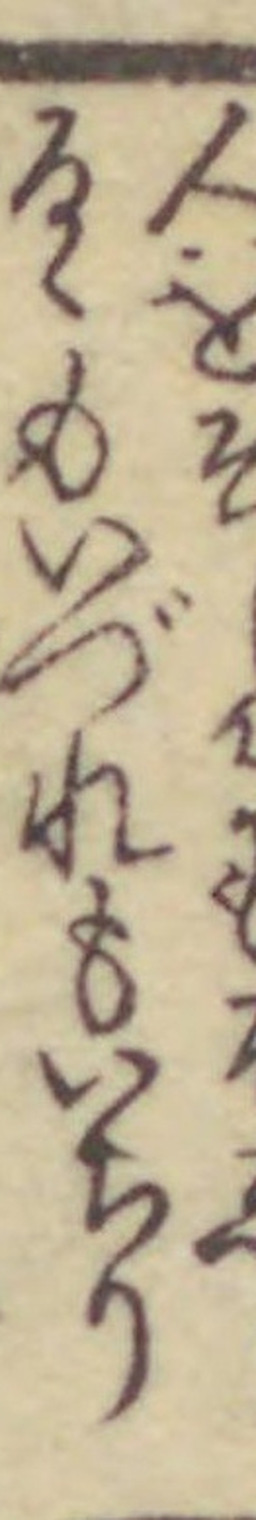るゝもいづれもいちり
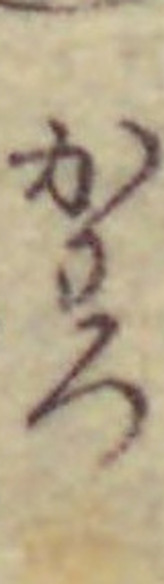かわつ
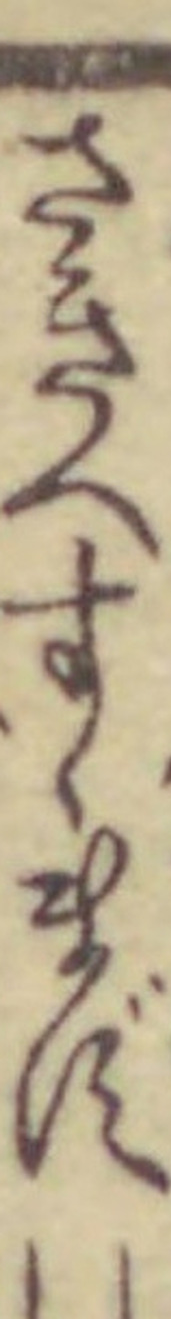さきへすゝまず
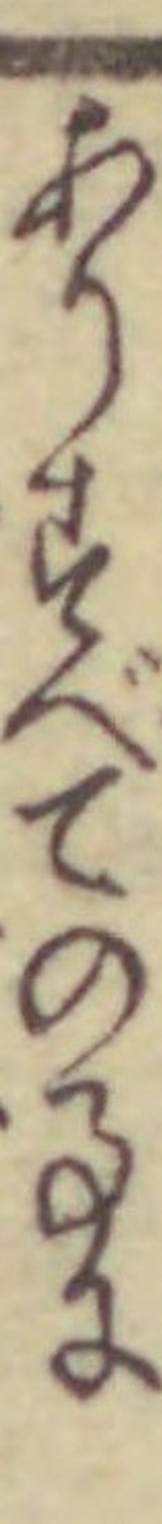ありすべての事に
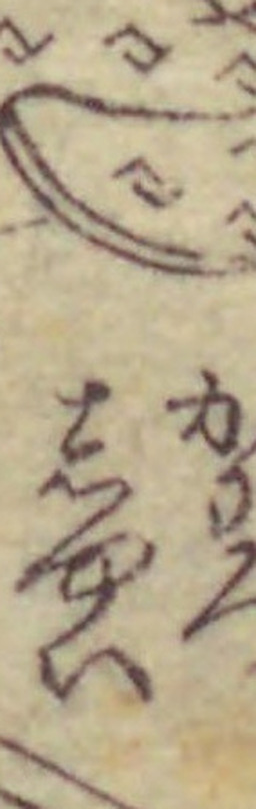しやい
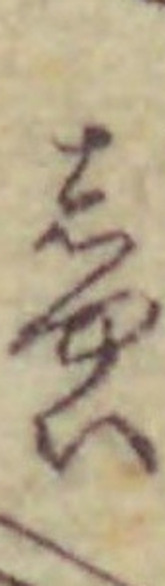しやい
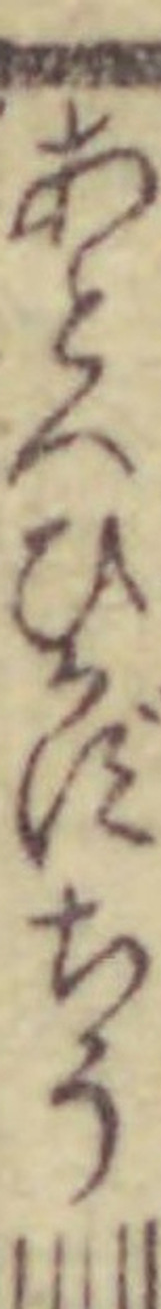あとへひかずちう
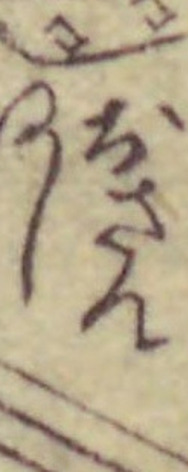おさん
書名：大通人穴[サガシ] 3巻
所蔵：国立国会図書館 National Diet Library, JAPAN
